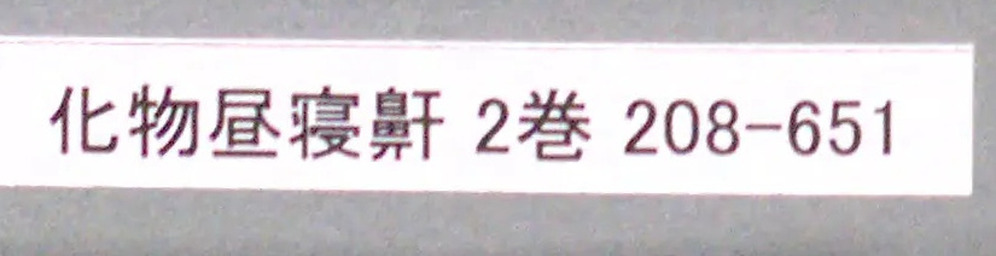化物昼寝鼾完

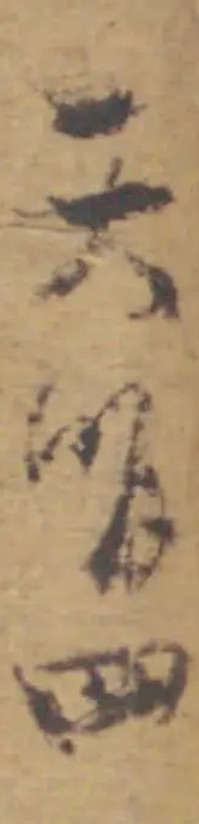天明四
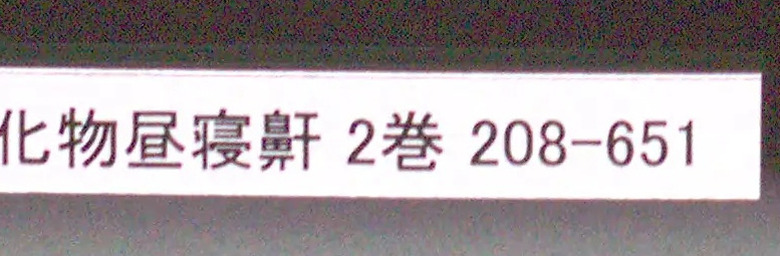化物昼寝鼾上下
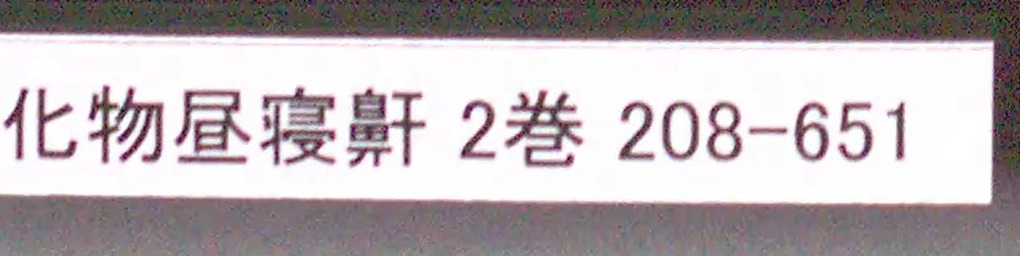化物昼寝鼾上下

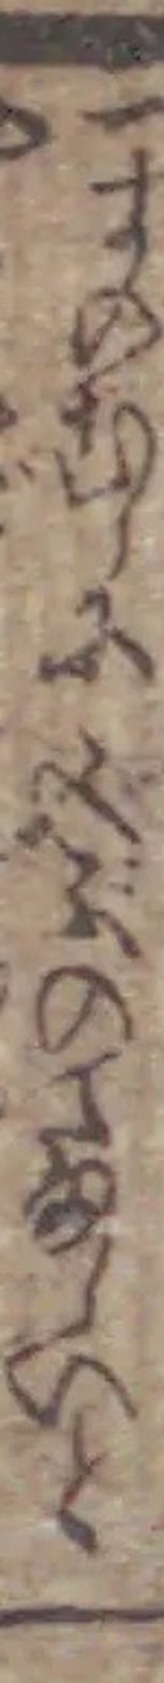一寸のむしに五ぶのたましいと

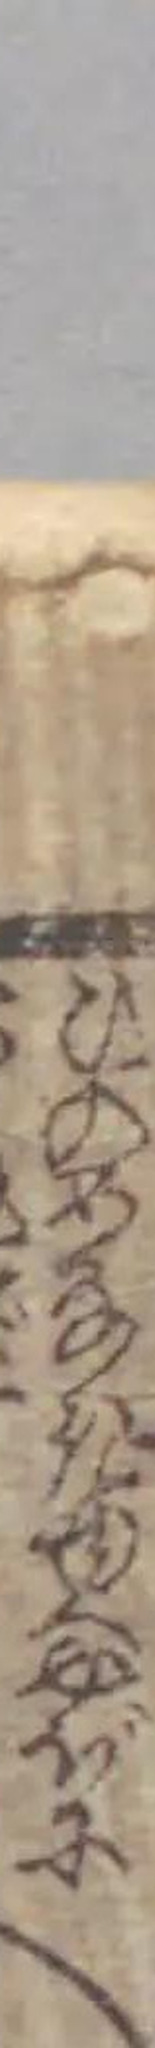ひのめなきゆへやぼに
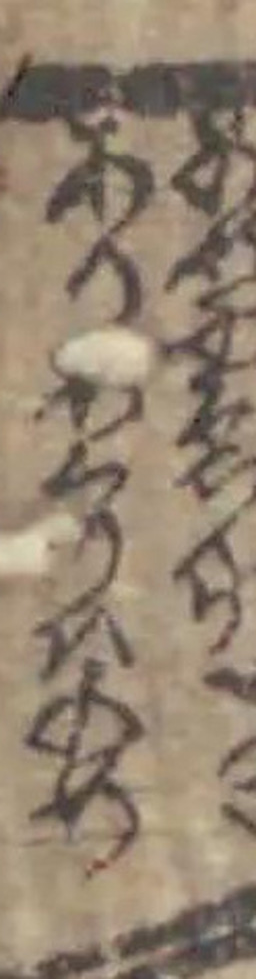ありめくりはあめ
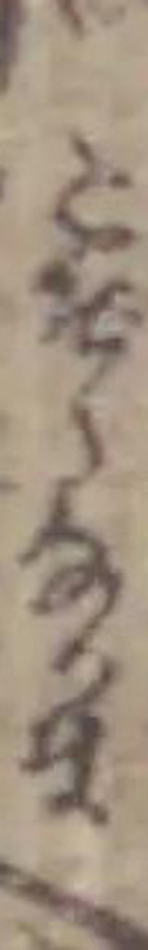こぞうなかま
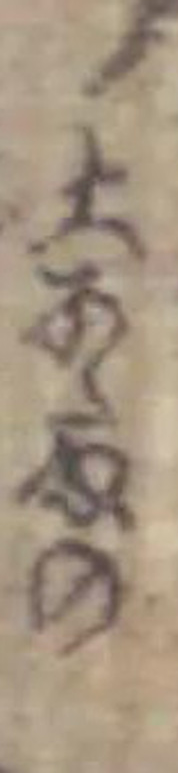大あたまの
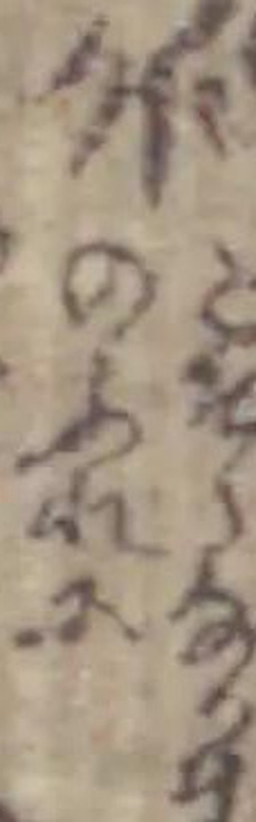のふれに

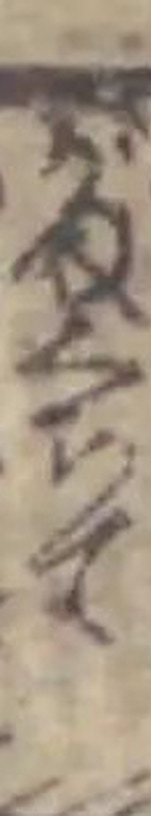がまくちて
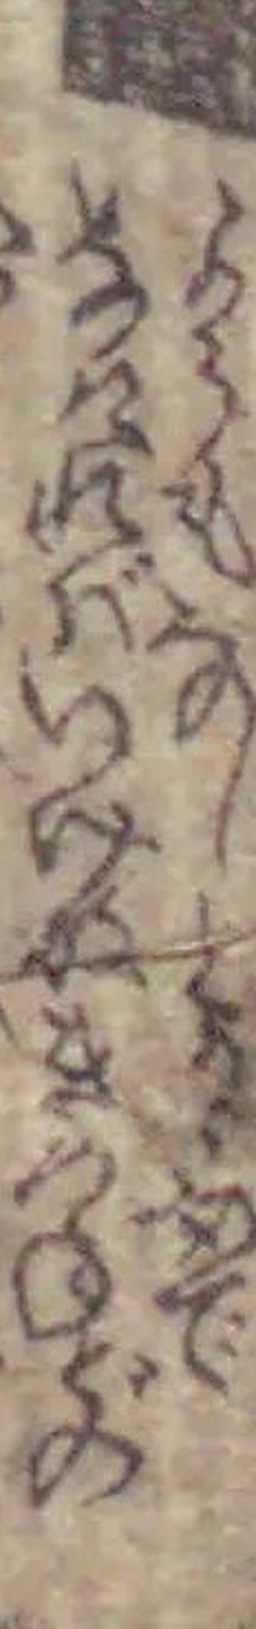なければいけぬきつねどの
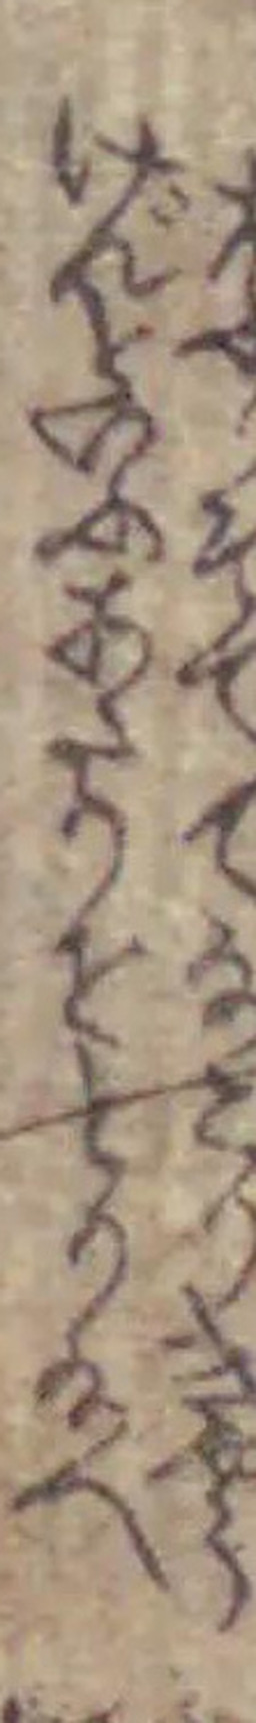げんといふあたりをとり給へ
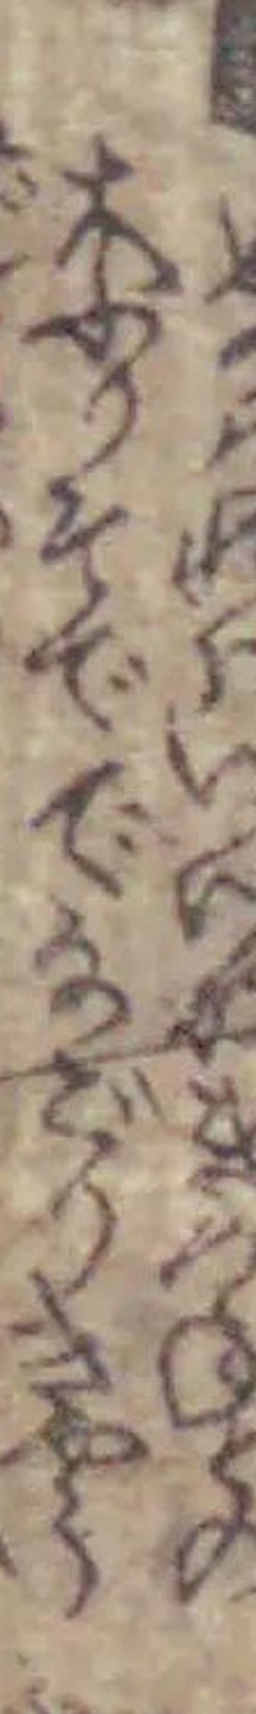大ふりそででなごりきやう
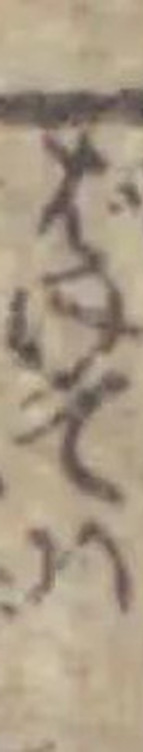ばけては
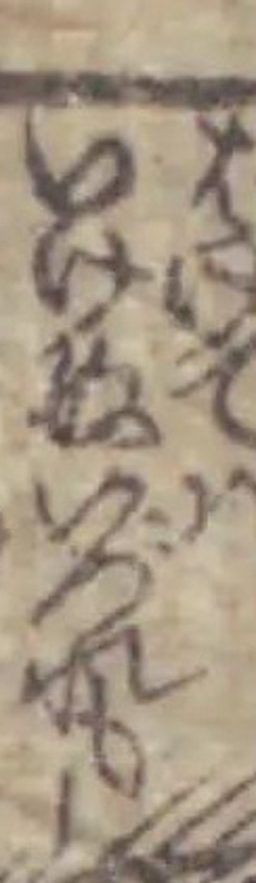いけぬいづれも
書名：化物昼寝鼾 2巻
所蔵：国立国会図書館 National Diet Library, JAPAN
